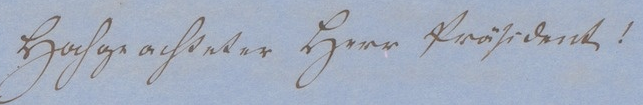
Hochgeachteter Herr Präsident!
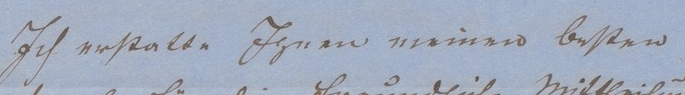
Ich erstatte Ihnen meinen besten
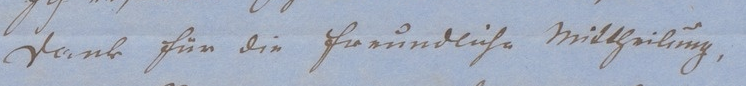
Dank für die freundliche Mittheilung,
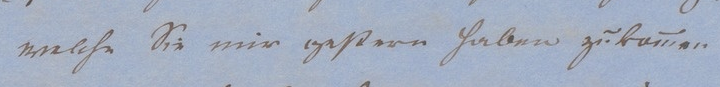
welche Sie mir gestern haben zukommen
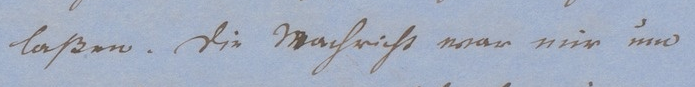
laßen. Die Nachricht war mir um
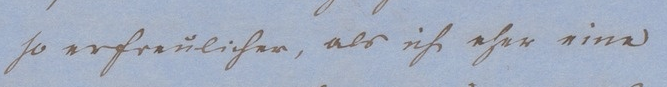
so erfreulicher, als ich eher eine
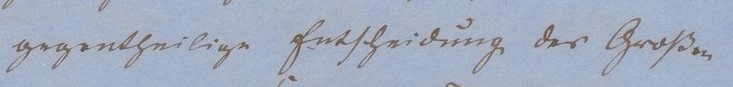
gegentheilige Entscheidung des Großen
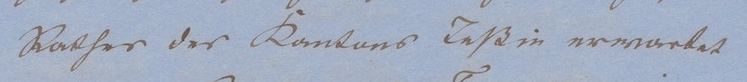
Rathes des Kantons Teßin erwartet
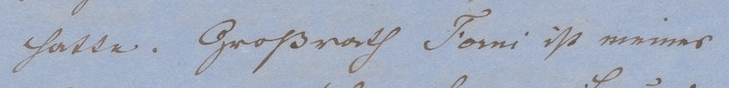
hatte. Großrath Forni ist meines
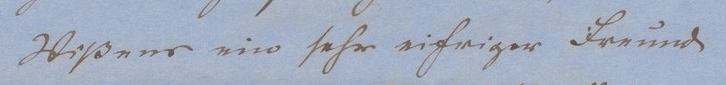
Wißens ein sehr eifriger Freund
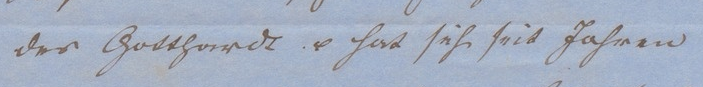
des Gotthardt & hat sich seit Jahren
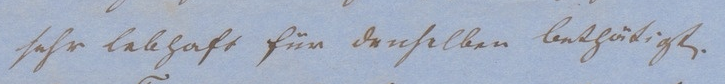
sehr lebhaft für denselben bethätigt.
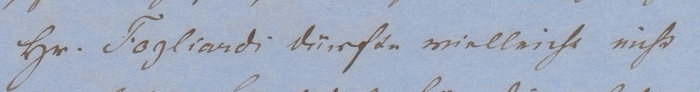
Hr. Fogliardi dürfte vielleicht nicht
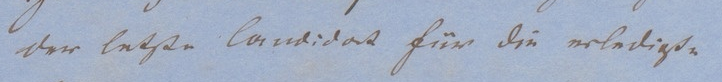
der letzte Candidat für die erledigte
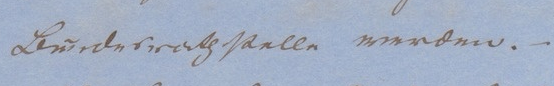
Bundesrathstelle werden. –
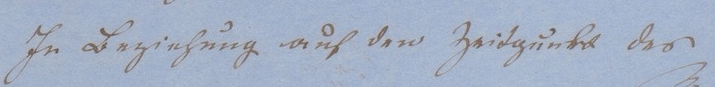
In Beziehung auf den Zeitpunkt des
